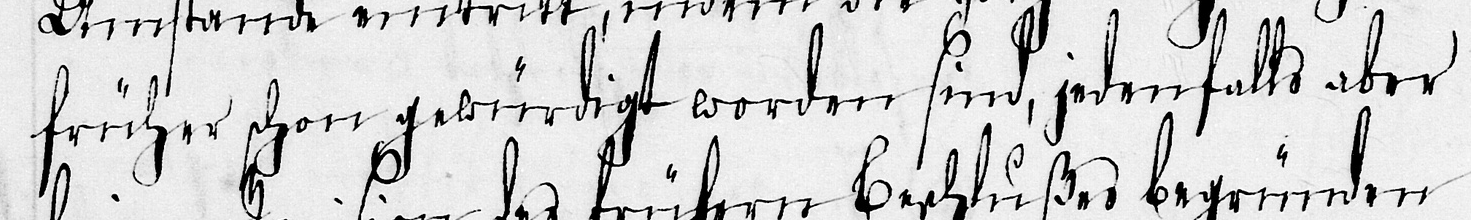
früher schon gewürdigt worden sind, jedenfalls aber
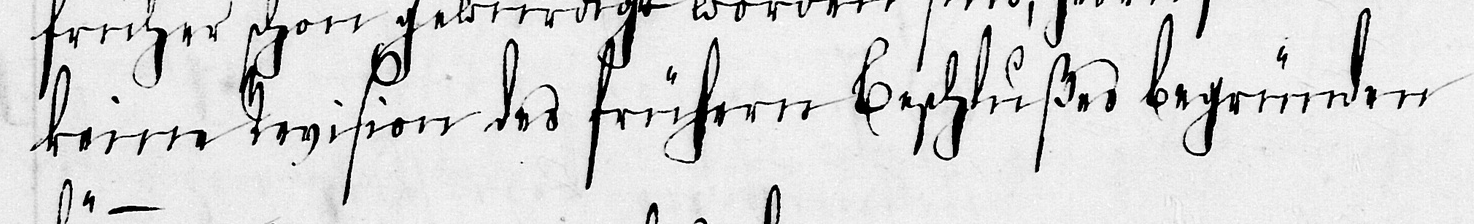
keine Revision des frühern Beschlußes begründen
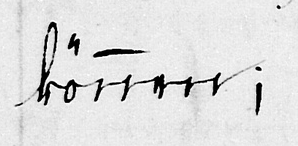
können;
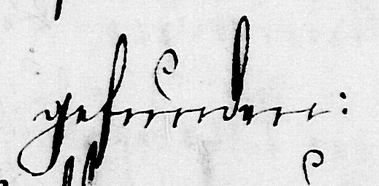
gefunden:
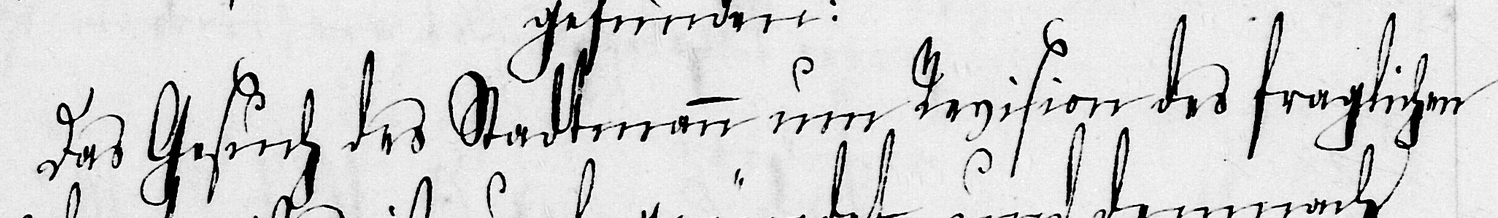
Das Gesuch des Stadtmann um Revision des fraglichen
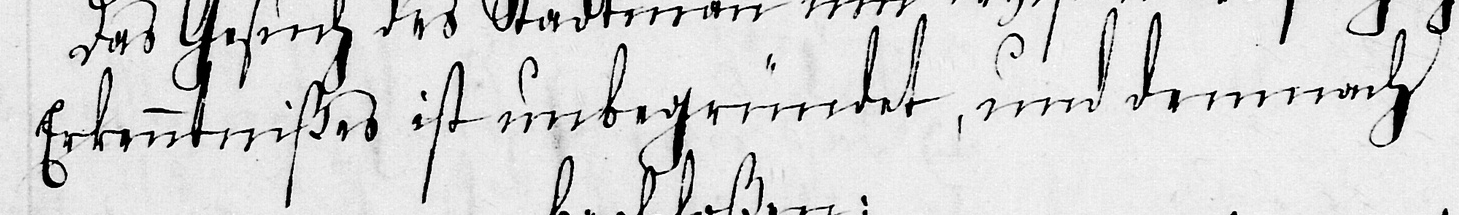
Erkenntnißes ist unbegründet, und demnach
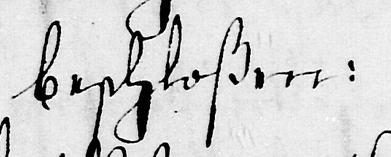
beschloßen:
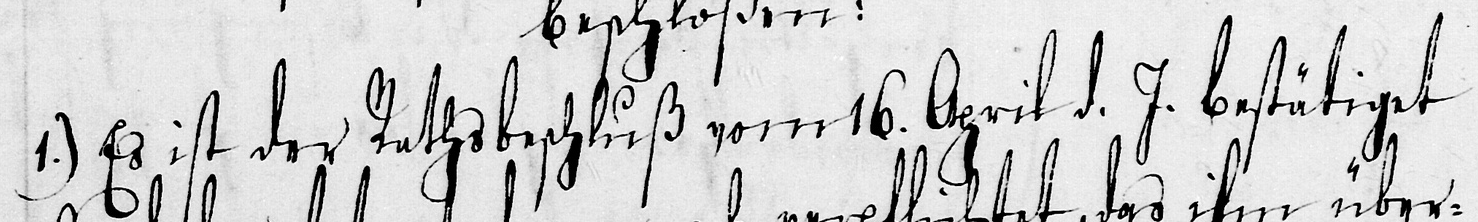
1.) Es ist der Rathsbeschluß vom 16. April d. J. bestätigt
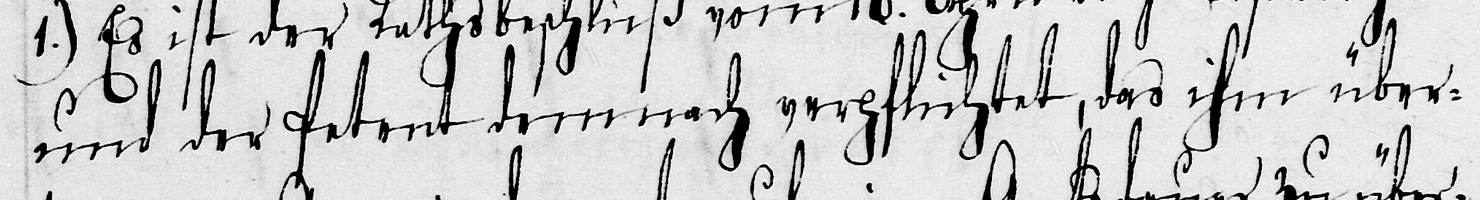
und der Petent demnach verpflichtet, das ihm über¬
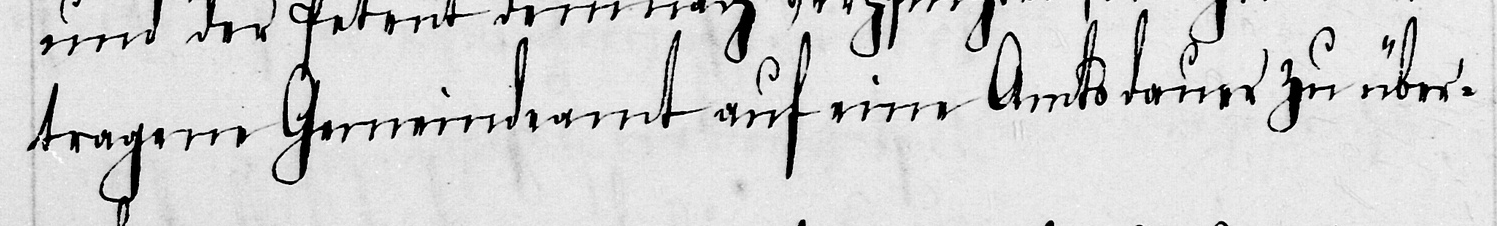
tragene Gemeindeamt auf eine Amtsdauer zu über¬
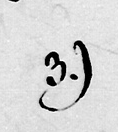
2.)
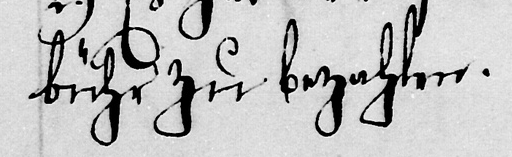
ebühr zu bezahlen.
